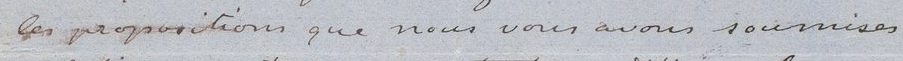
les propositions que nous vous avons soumises
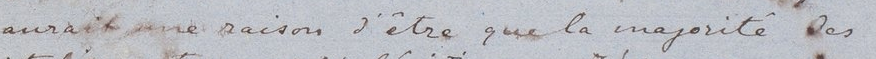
aurait une raison d'être que la majorité des
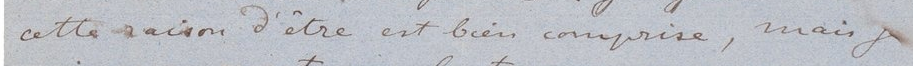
cette saison d'être est bien comprise, mais je
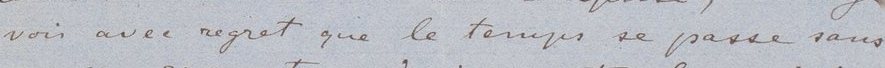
vois avec regret que le temps se passe sans
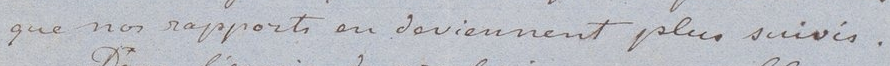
que nos rapports en deviennent plus suivis.
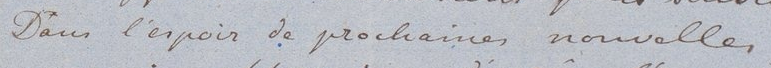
Dans l'espoir de prochaines nouvelles,
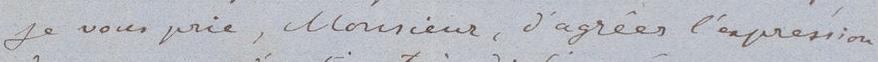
je vous prie, Monsieur, d'agréer l'expression
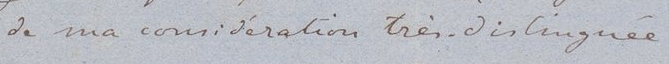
de ma considération très-distinguée
